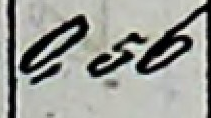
0,56
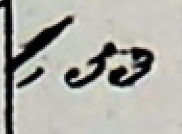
1,53
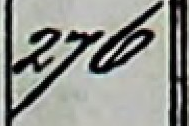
276
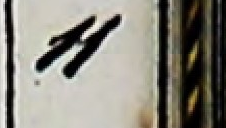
11
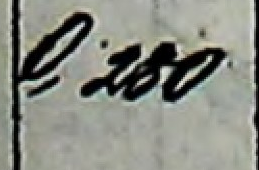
0,280
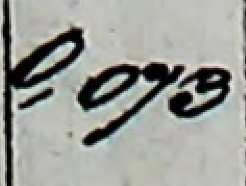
0,073
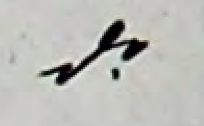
do
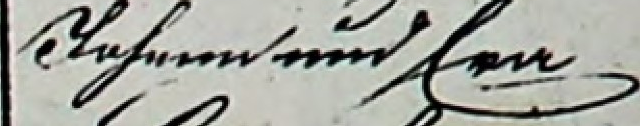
Johann und Eva
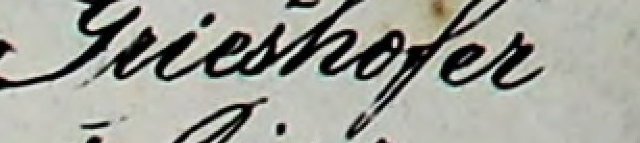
Grieshofer
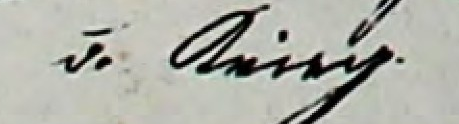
v. Krieg
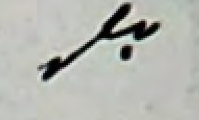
do
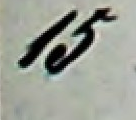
15
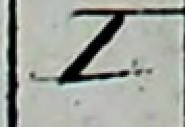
I
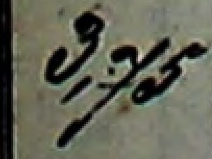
3,75
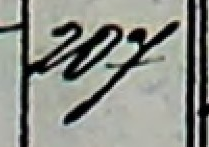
207
